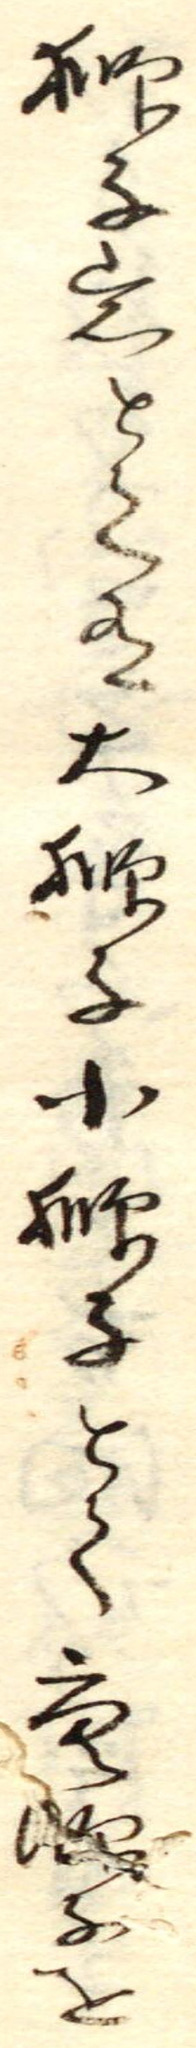獅子岩とて有大獅子小獅子とて唐獅子を
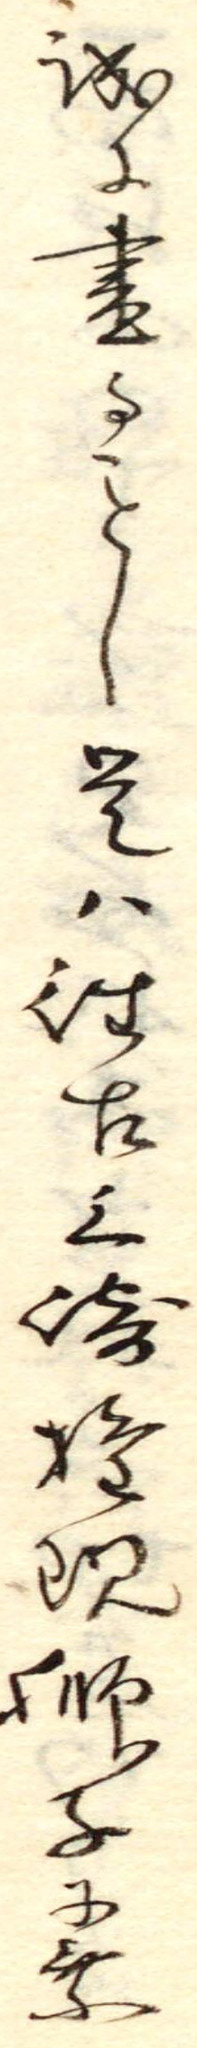誠に画ることし是は往古三崎権現獅子に乗
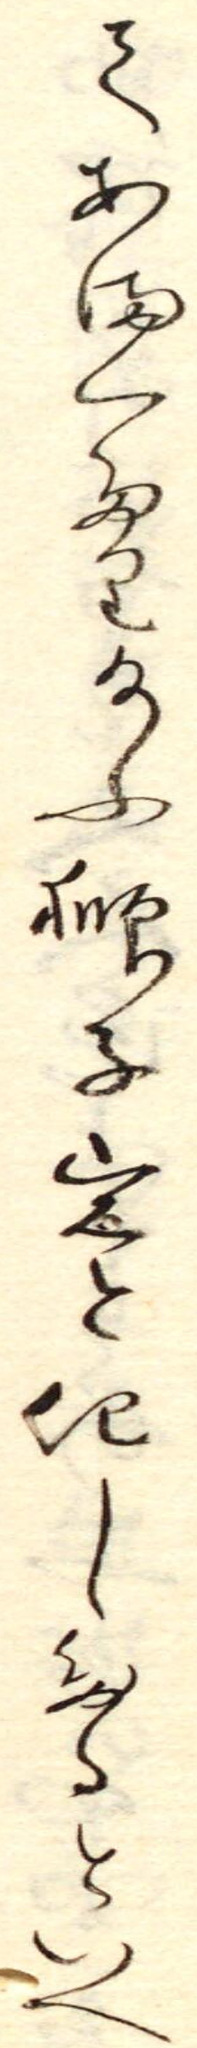てあまくたり給ふ獅子岩と化したるといへ
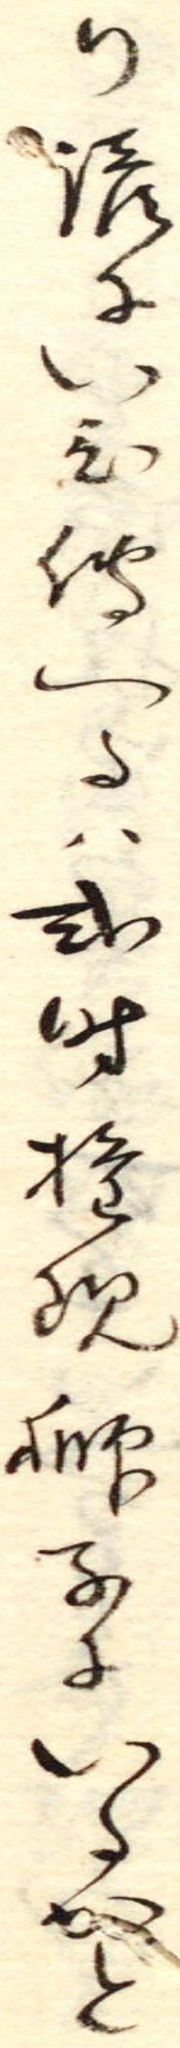り諺にいひ伝へるは或時権現獅子にいるかと
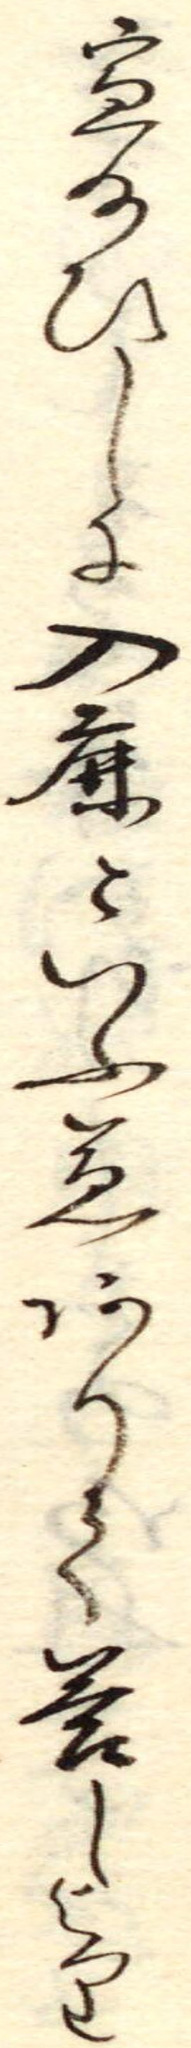宣給ひしに入鹿といふ兼ありて答しより
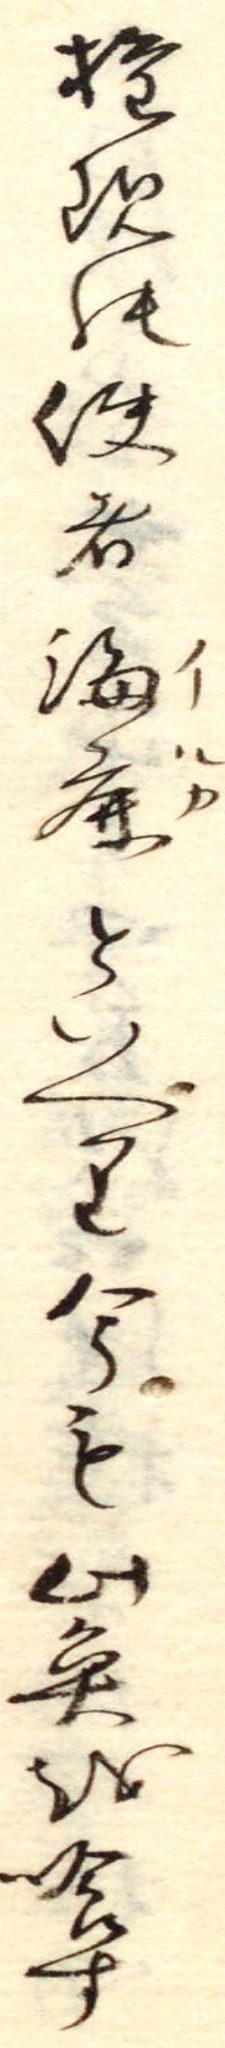権現の使者海鹿といへり今も此魚を喰す
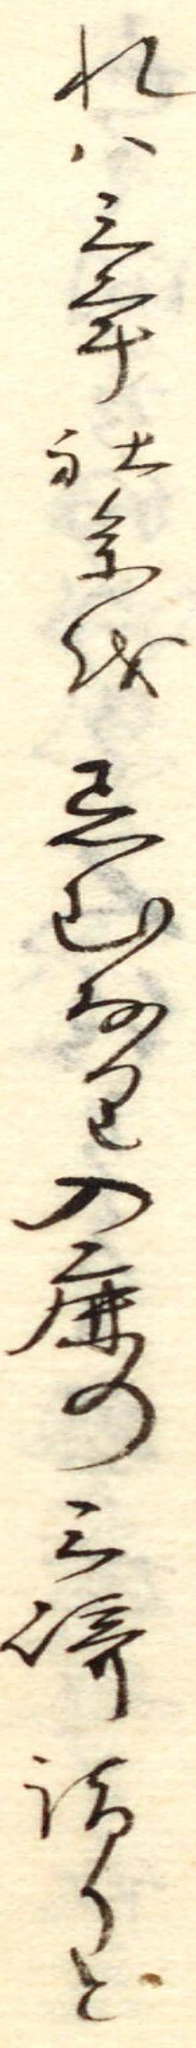れは三年社参を忌むなり入鹿の三崎詣りと
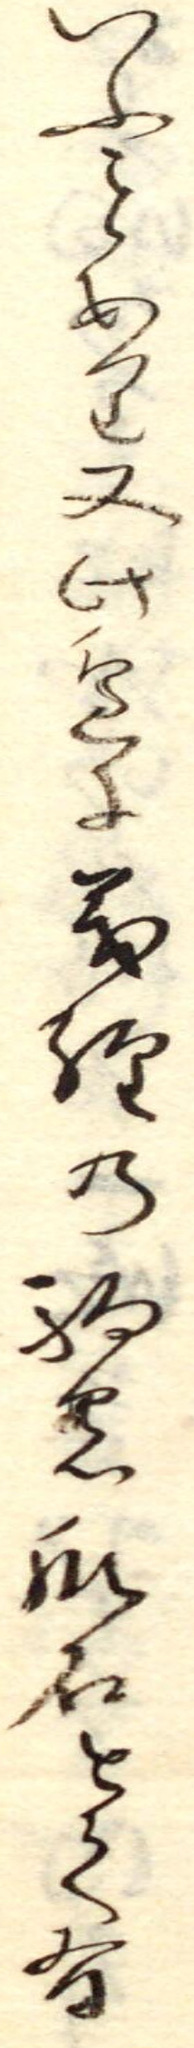いふことあり又此辺に義経の駒の爪石とて有
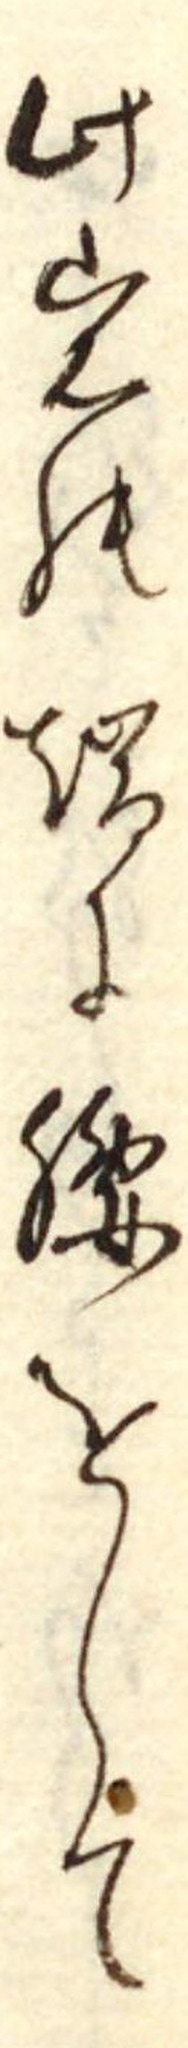此岩の端に腰をして
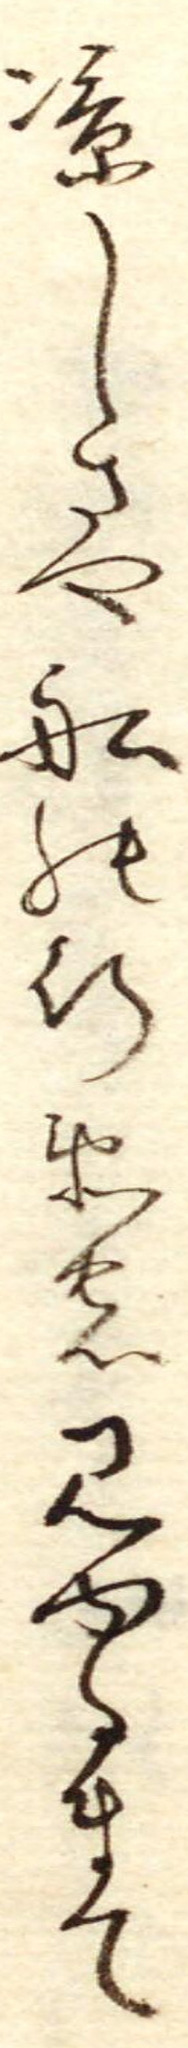すずしさや船の行えの見ゆるまて
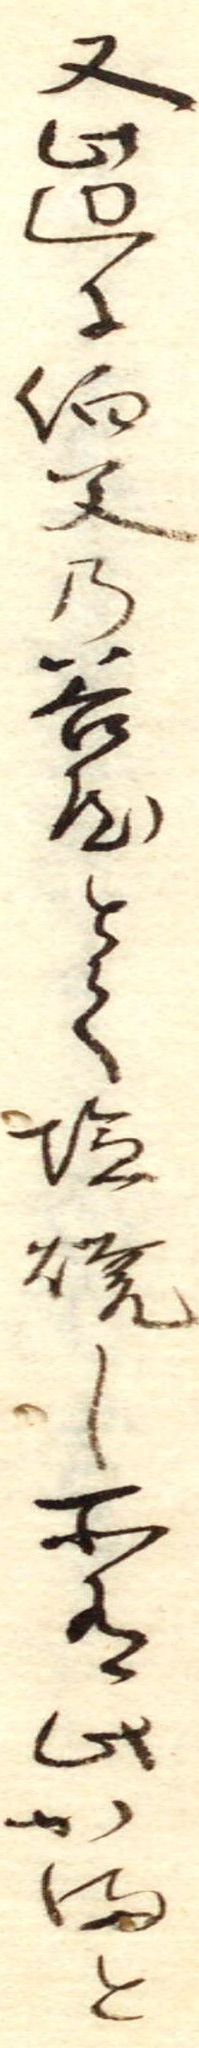又此辺に伯父の谷屋とて塩焼し所有此かまと
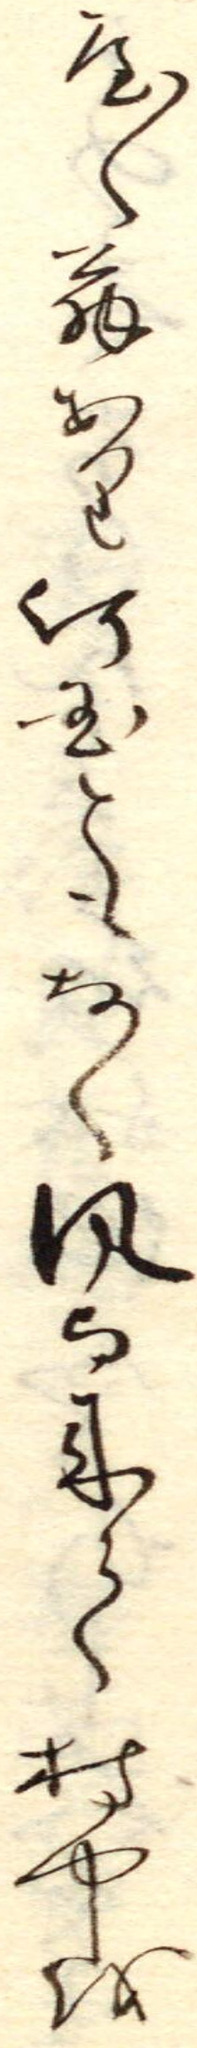屋之翁あり何国ともなく風与来て村中を
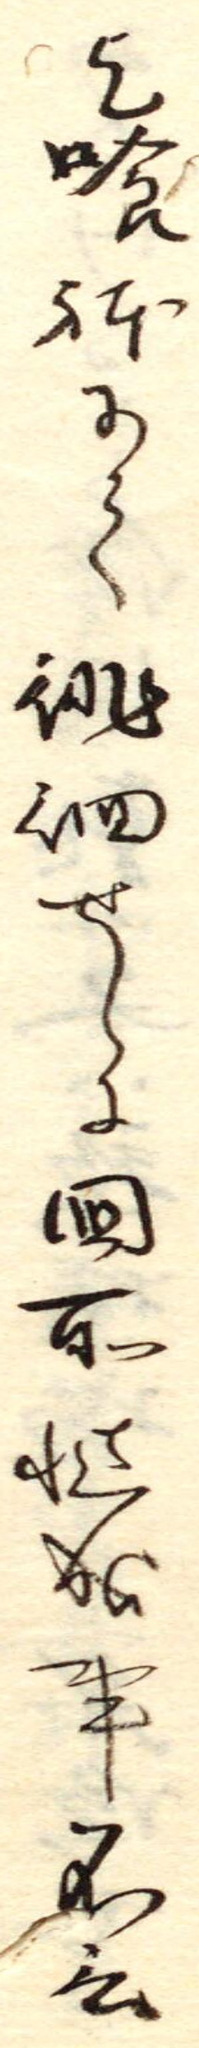乞喰躰にて徘徊せしに国所慥成事不云
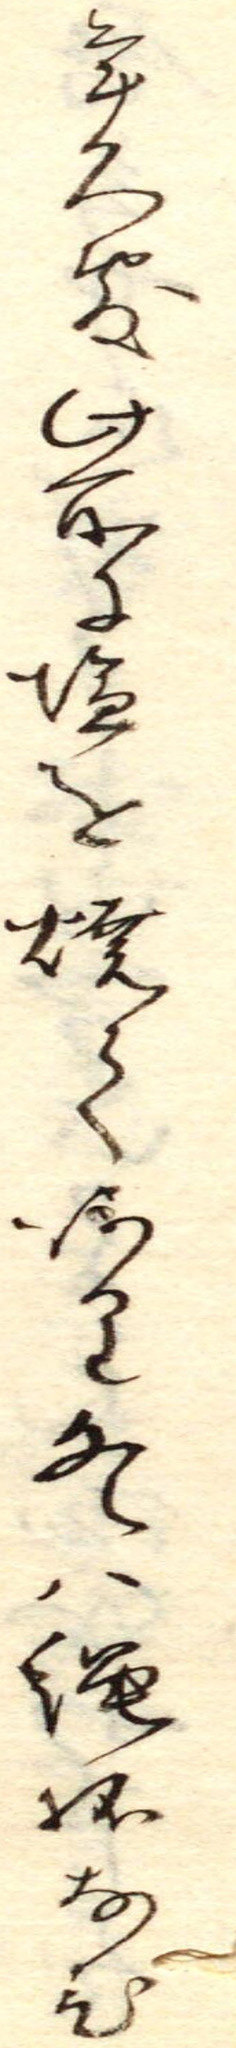年久敷此所に塩を焼てあり冬は縄抔なひ
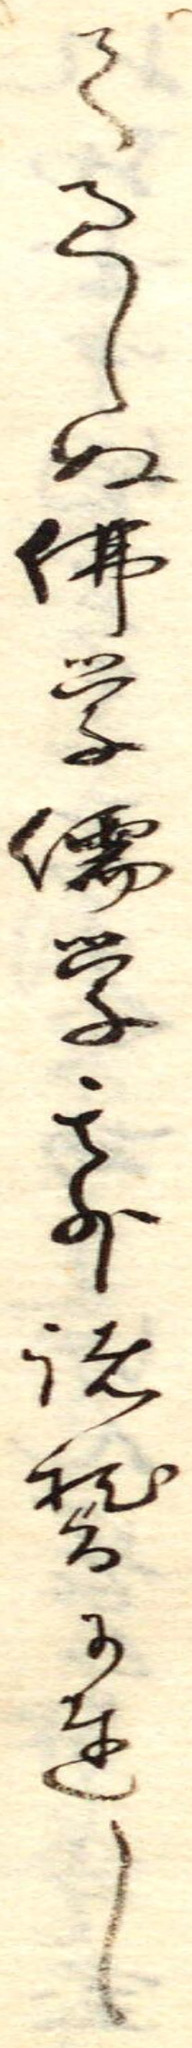て過しぬ仏学儒学其外諸稽に達し
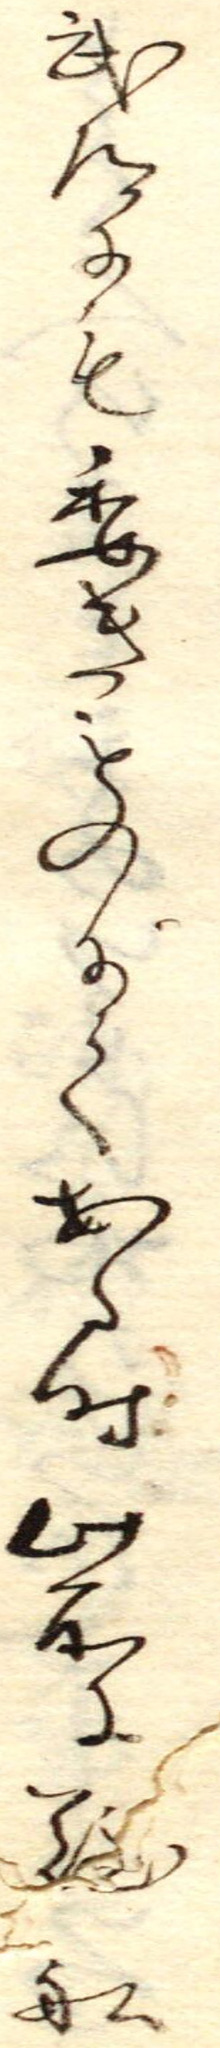武道にも委きものにてある時此所に難船
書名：能登名跡誌
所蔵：Ishikawa Prefectural Library
